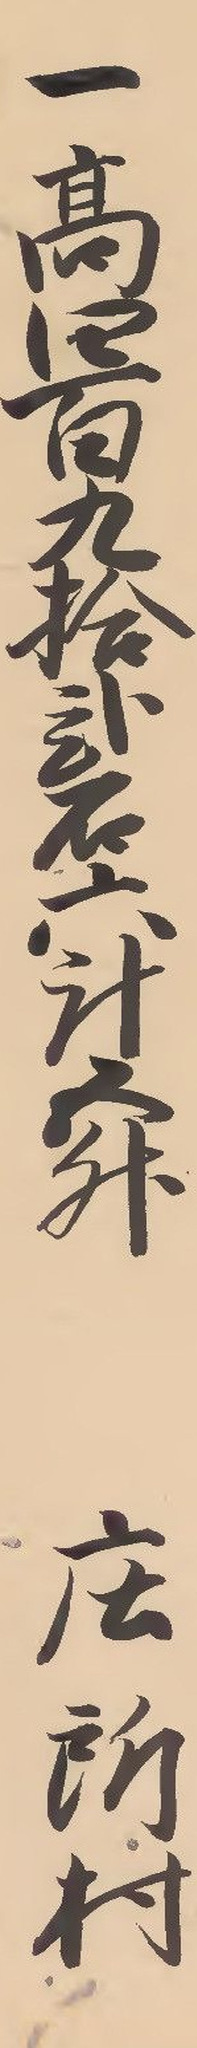一高四百九拾弐石六斗五升庄所村

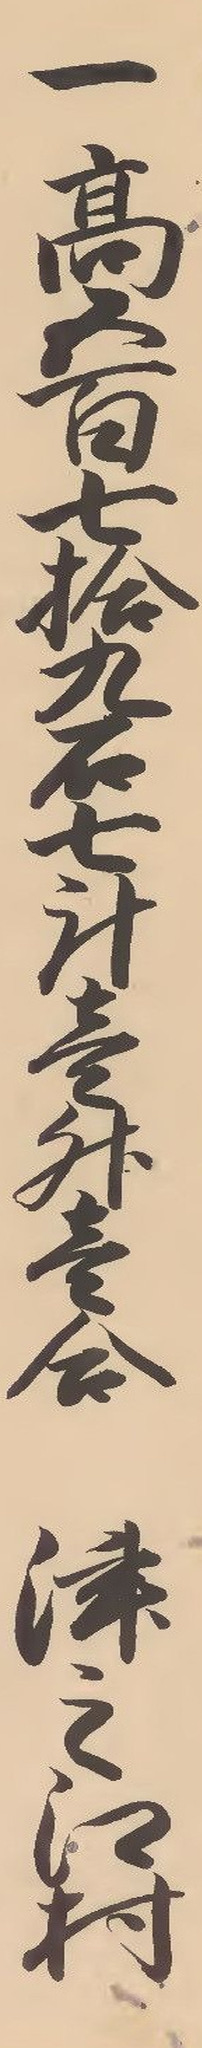一高五百七拾九石七斗壱升壱合津之江村
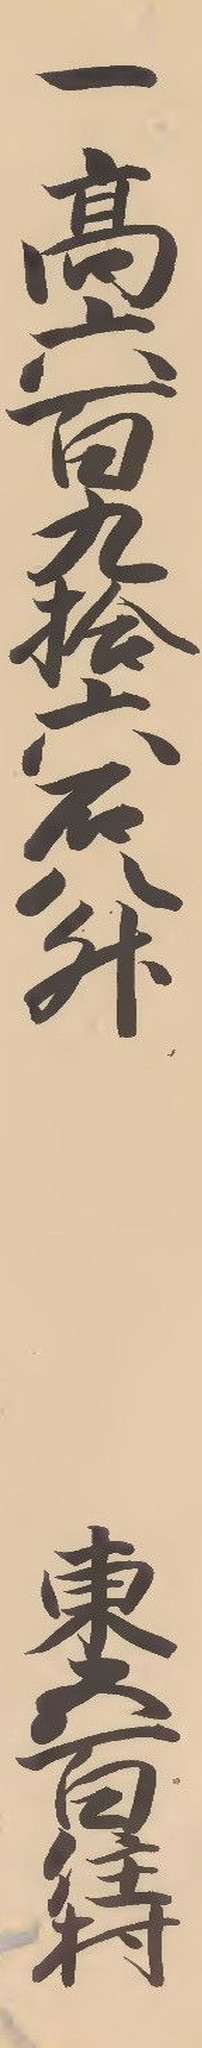一高六百九拾六石八升東五百住村
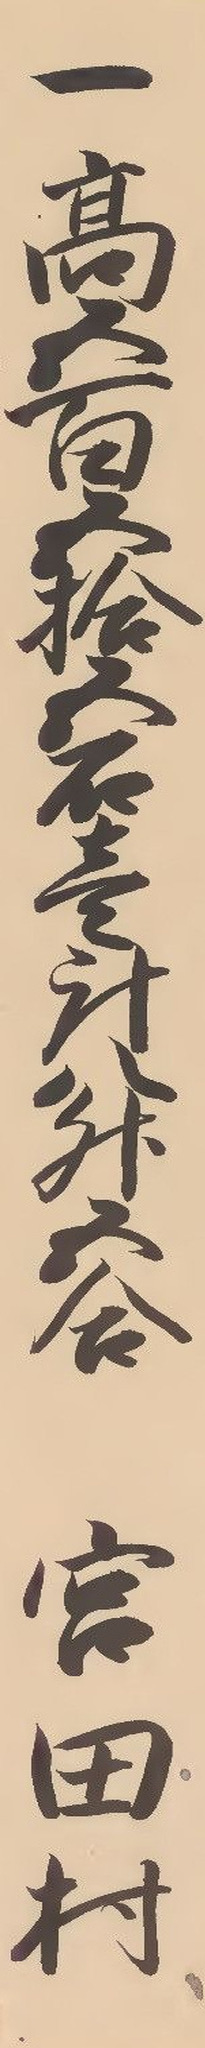一高五百五拾五石壱斗八升五合宮田村
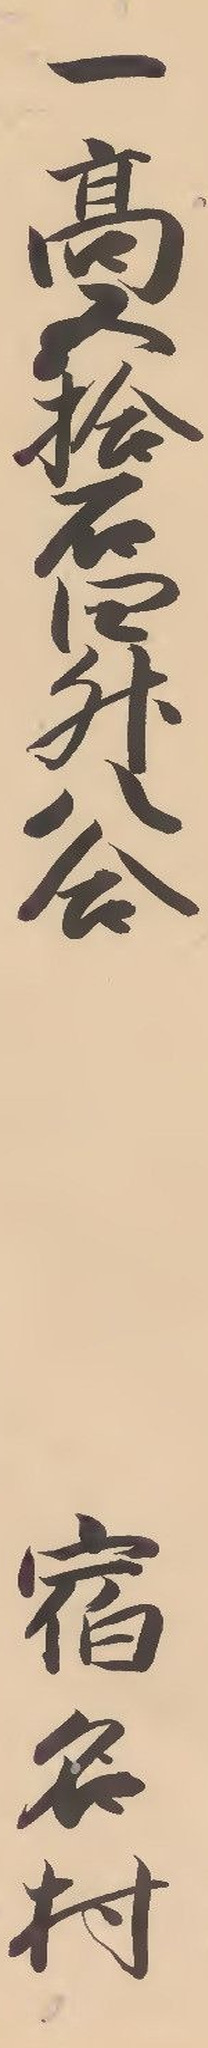一高五拾石四升八合宿名村
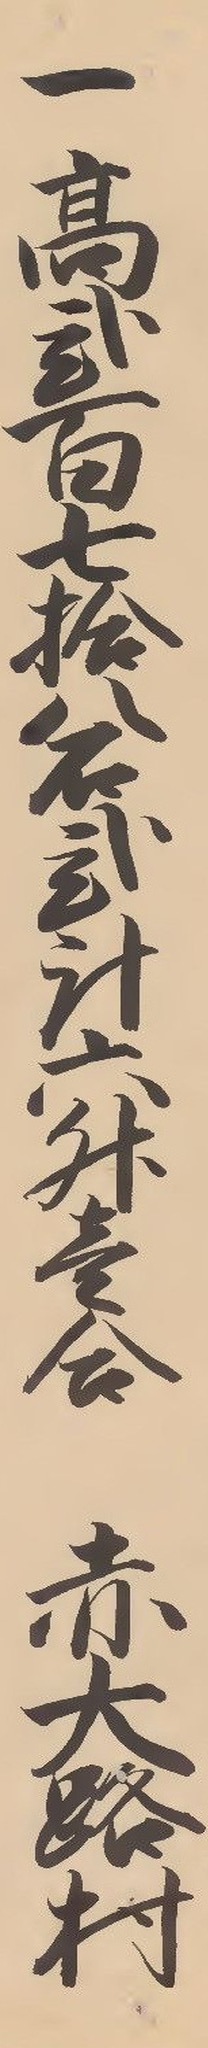一高弐百七拾八石弐斗六升壱合赤大路村
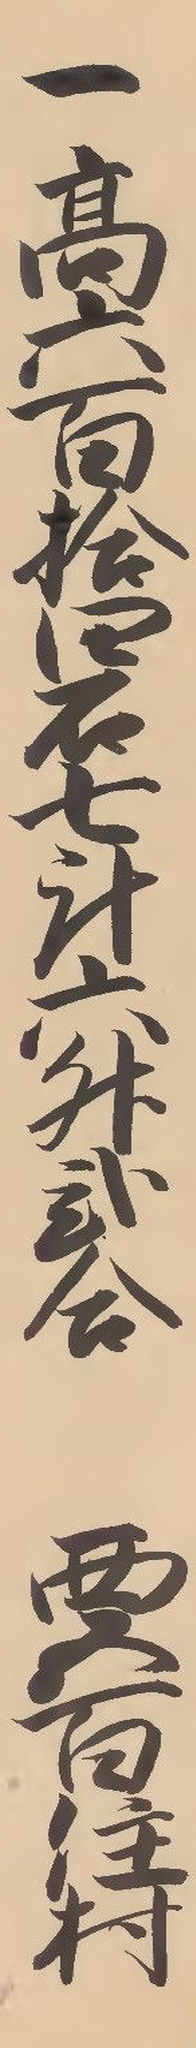一高六百拾四石七斗六升弐合西五百住村
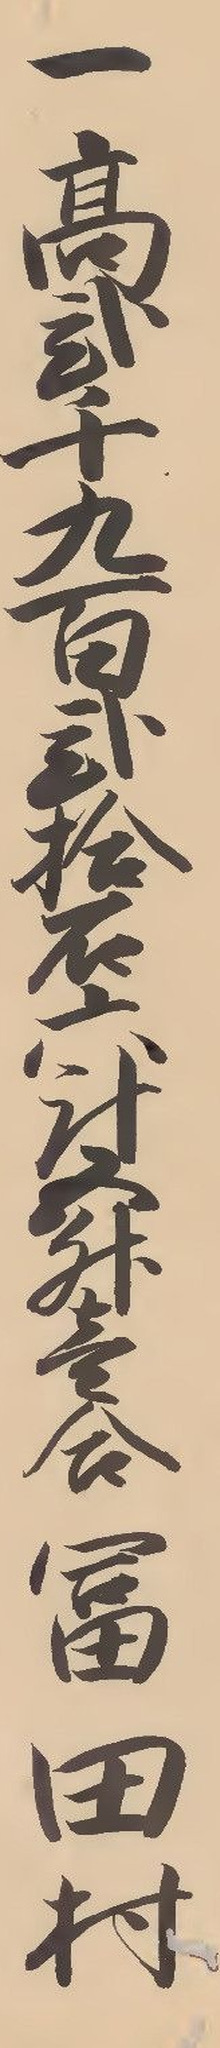一高弐千九百弐拾石六斗五升壱合富田村
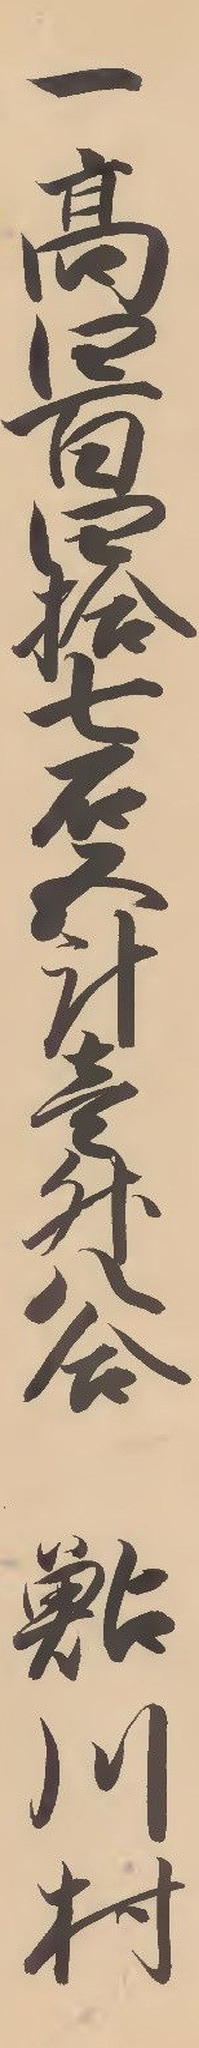一高四百四拾七石五斗壱升八合鮎川村

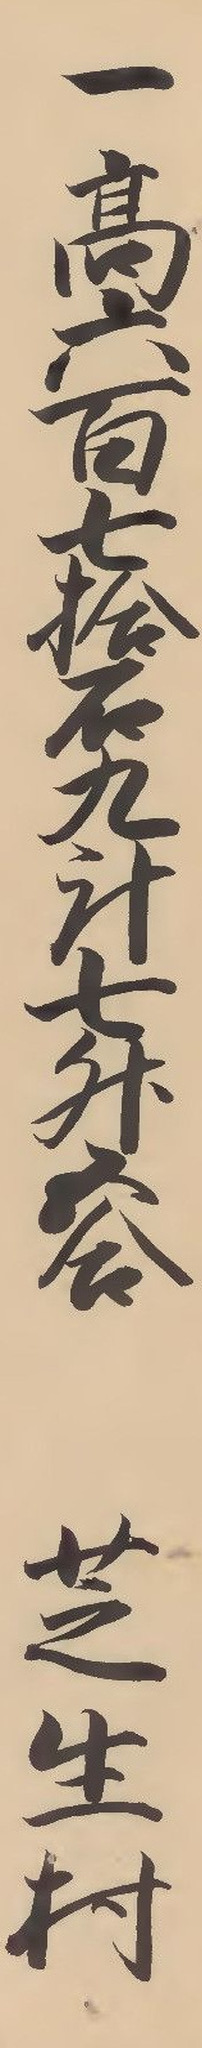一高六百七拾石九斗七升五合芝生村
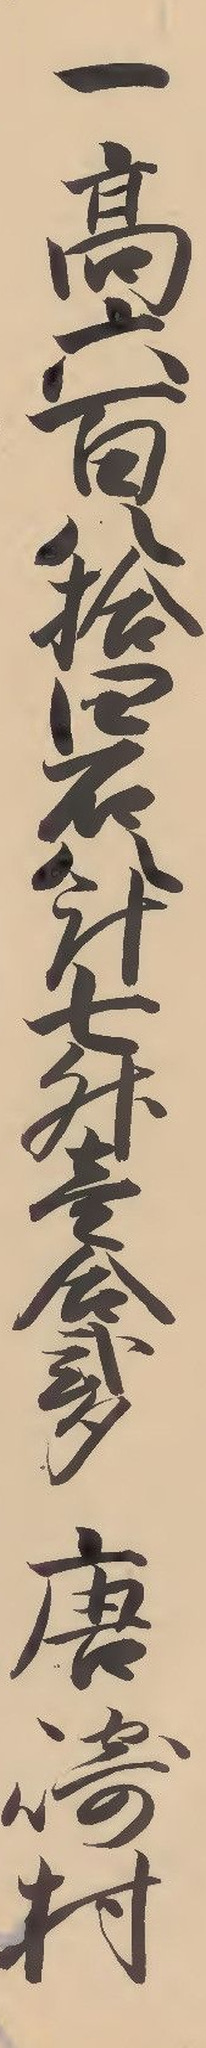一高六百八拾四石八斗八七升壱合弐勺唐崎村
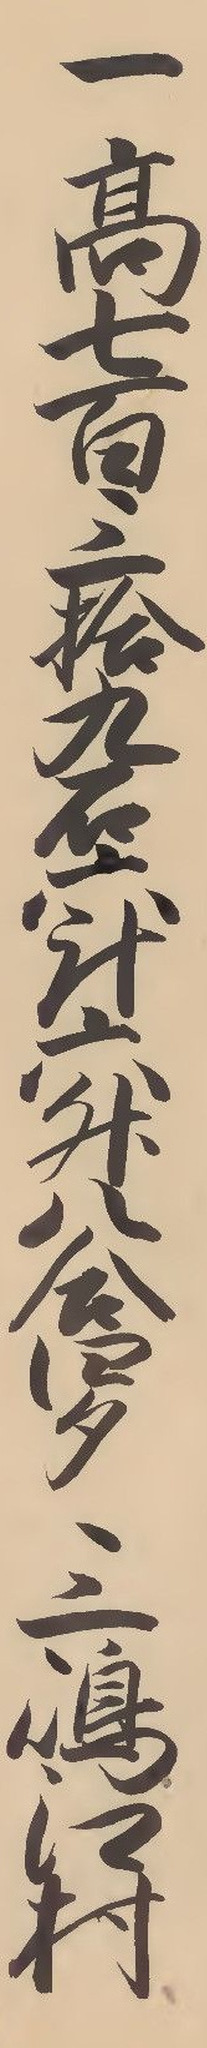一高七百三拾九石六斗六升八合四勺三嶋江村
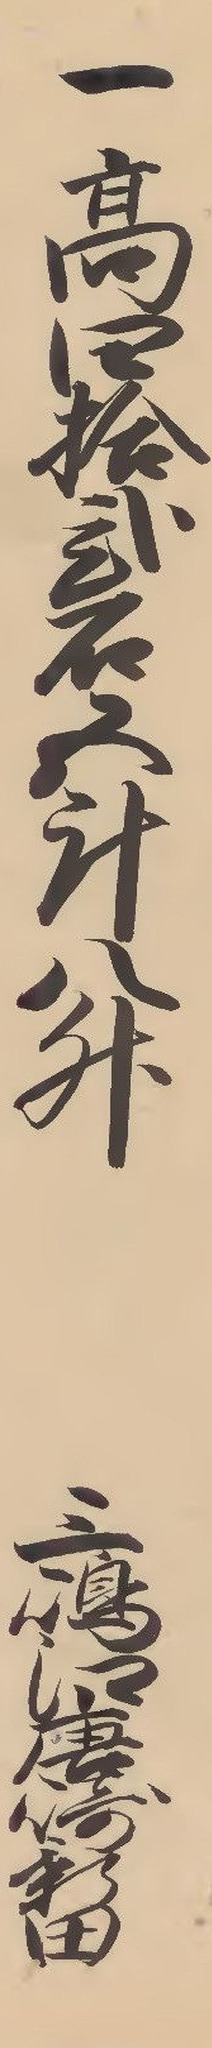一高四拾弐石五斗八升三嶋江唐崎新田
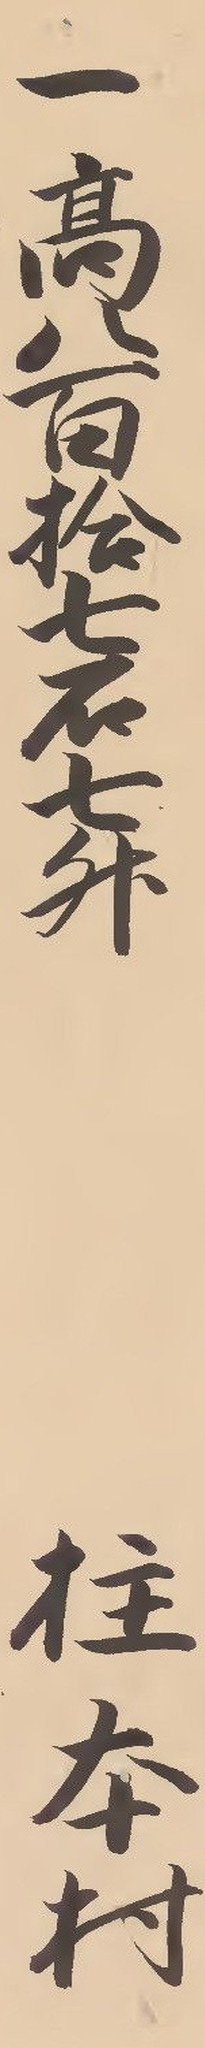一高八百拾七石七升柱本村
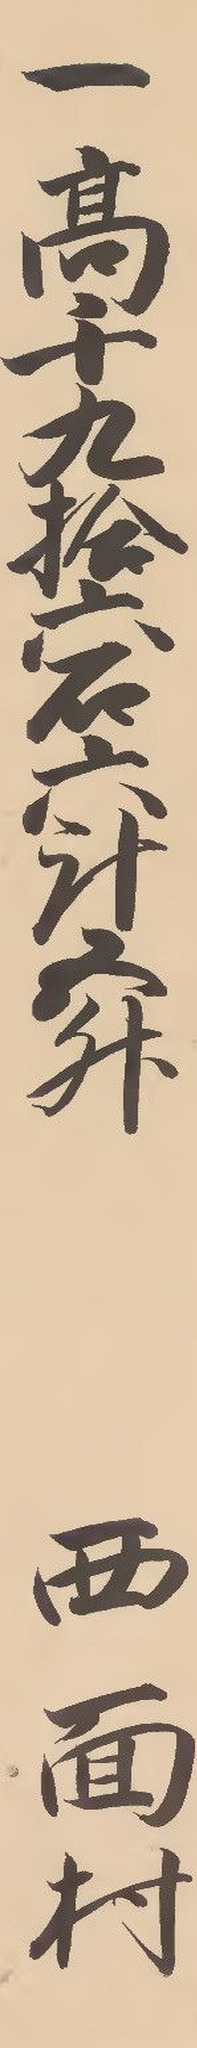一高千九拾六石六斗五升西面村
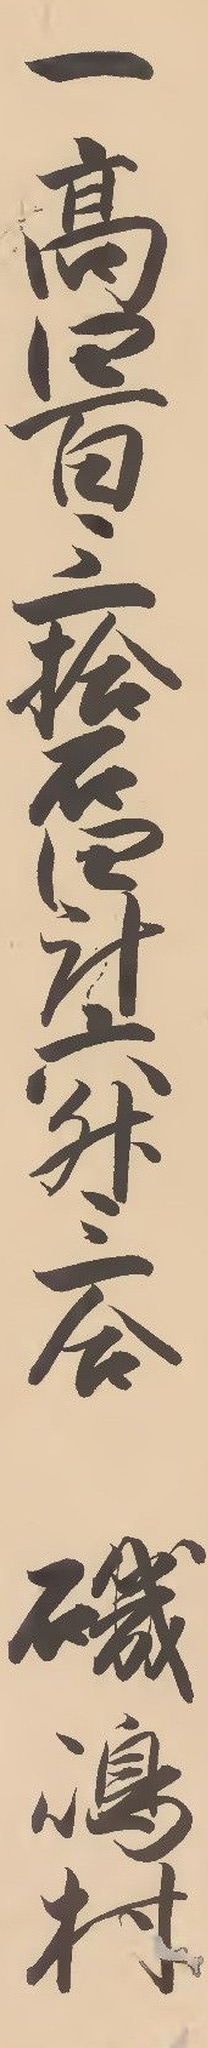一高四百三拾石四斗六升三合磯嶋村
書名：摂津国郷帳
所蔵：国立公文書館 National Archives of Japan
